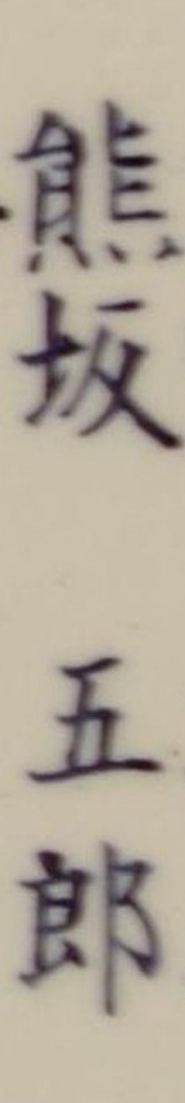熊坂五郎
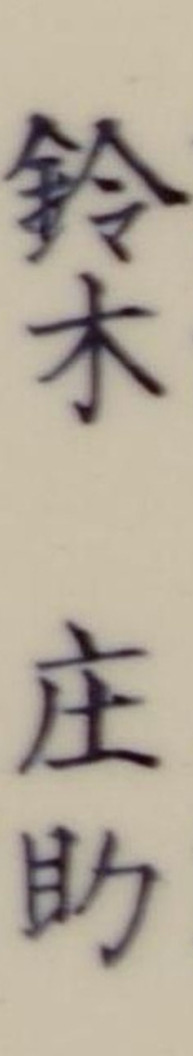鈴木庄助
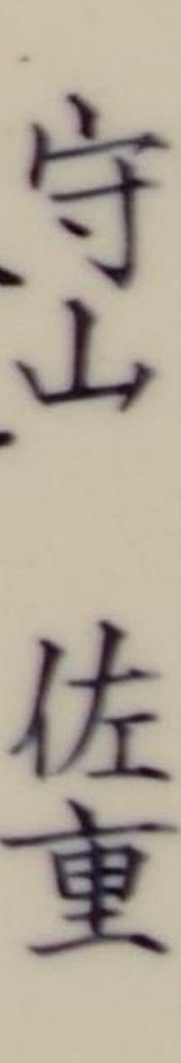守山佐重
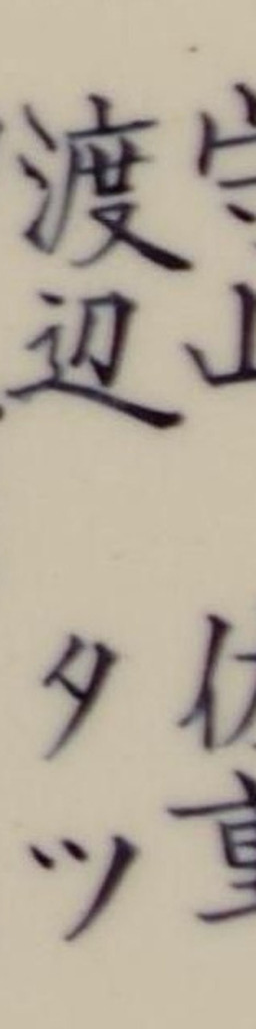渡辺タツ
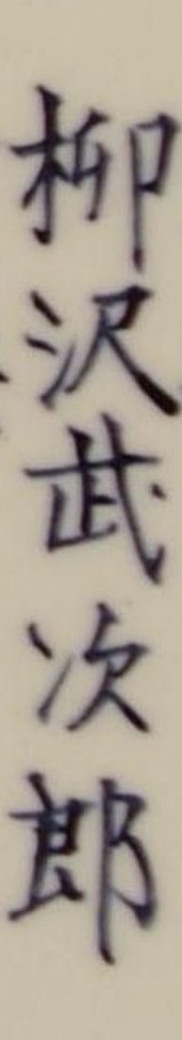柳沢武次郎
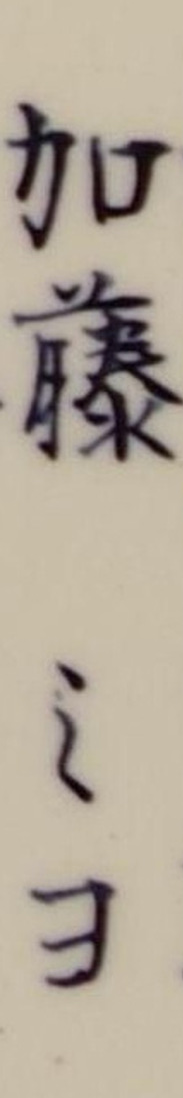加藤ミヨ
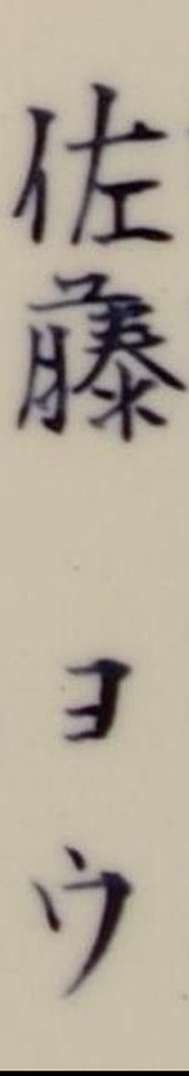佐藤ヨウ
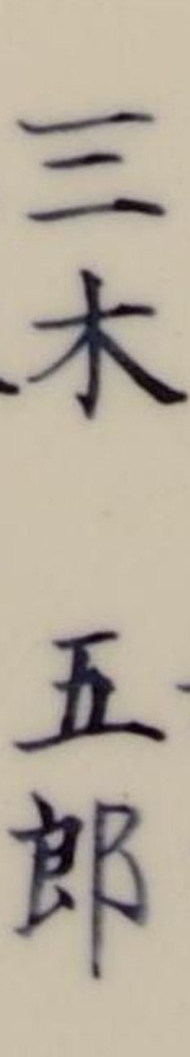三木五郎
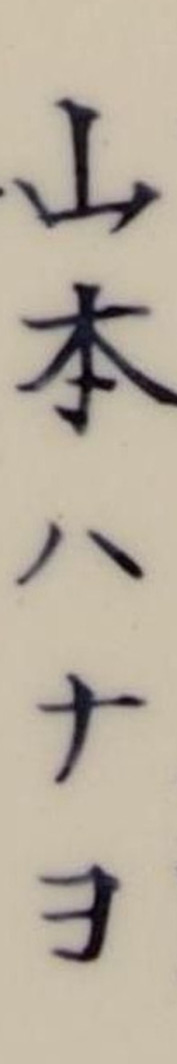山本ハナヨ
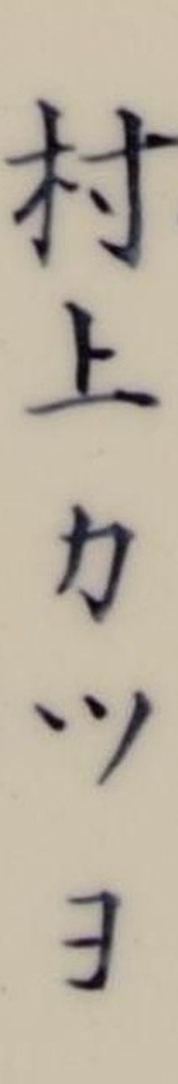村上カツヨ
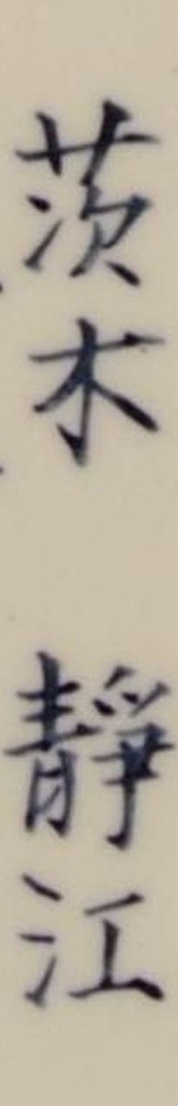茨木静江
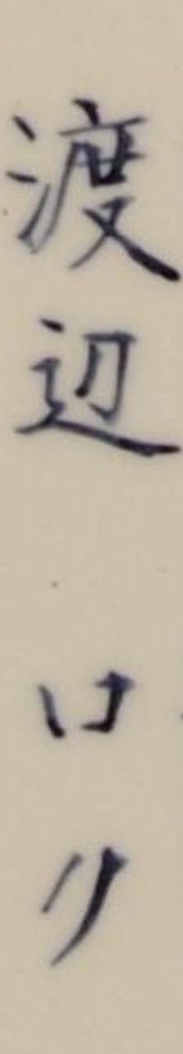渡辺ロク
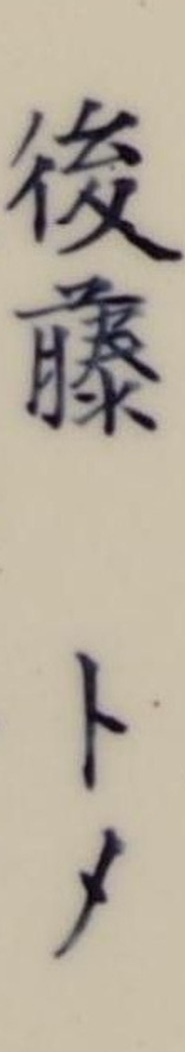後藤トメ
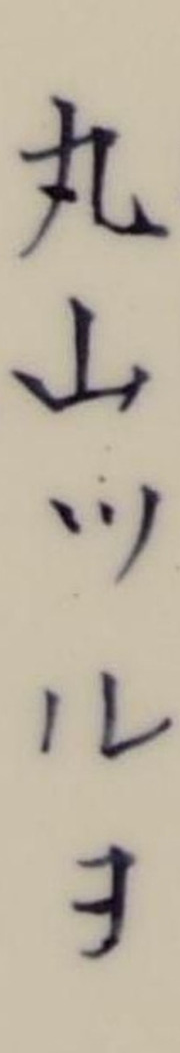丸山ツルヨ
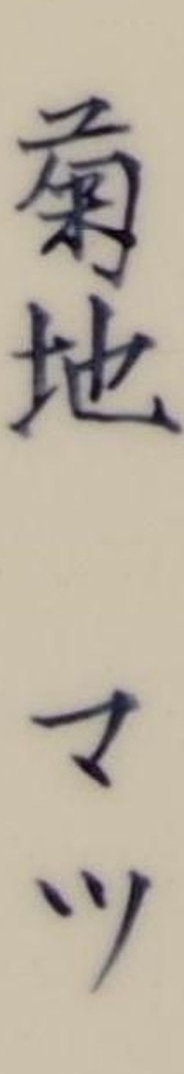菊地マツ
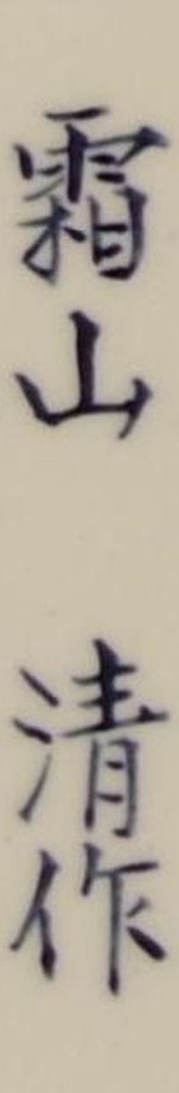霜山清作
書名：M~S
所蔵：高野山金剛峯寺
